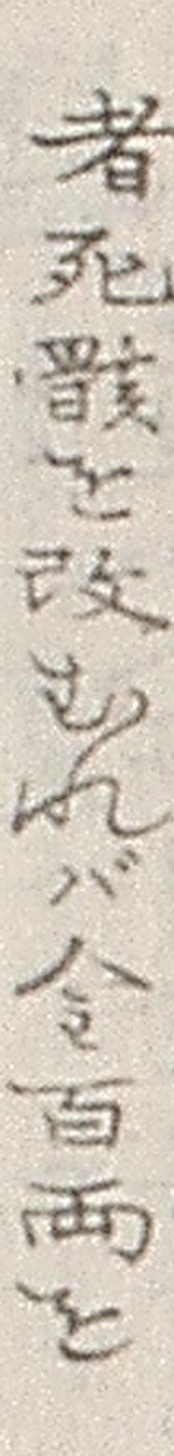者死骸を改むれば金百両を
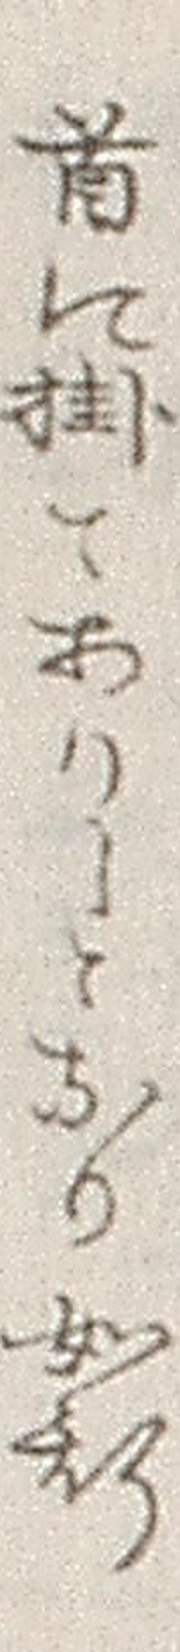首に掛てありしとなり如斯
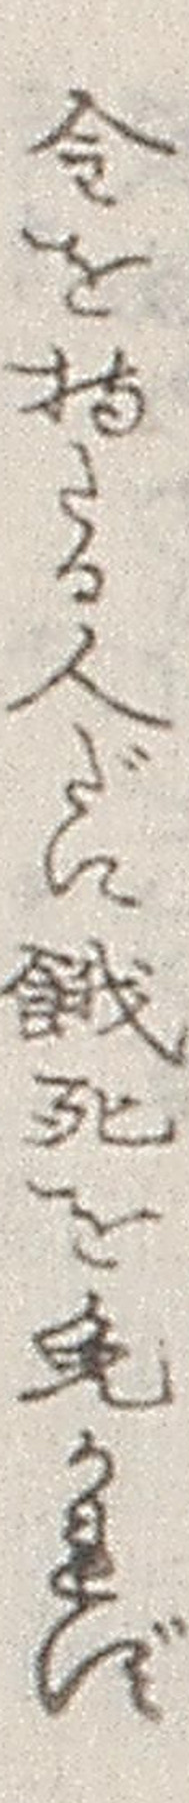金を持たる人だに餓死を免かれず
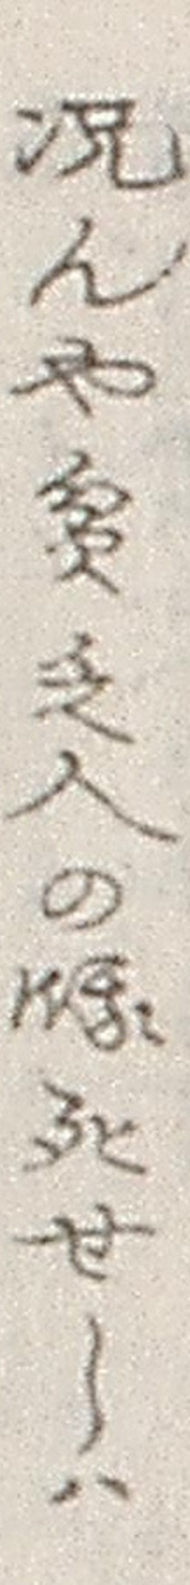況んや貧乏人の餓死せしは
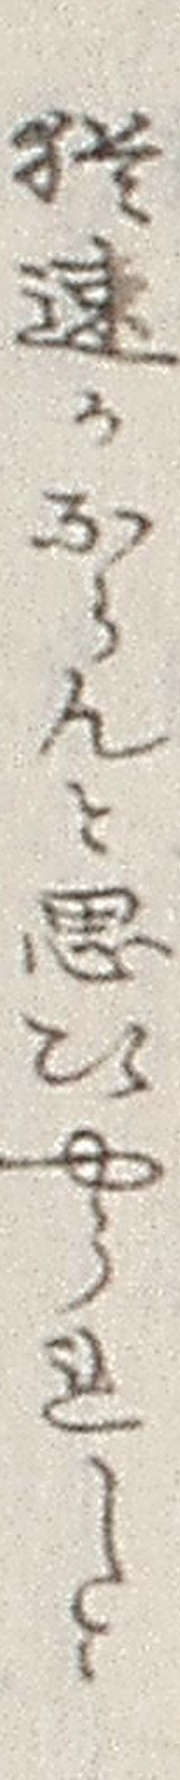猶速かならんと思ひやられしと
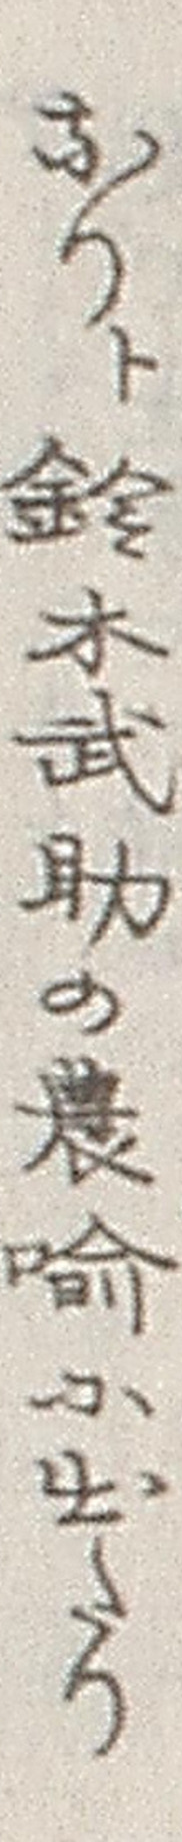なりト鈴木武助の農喩に出たり

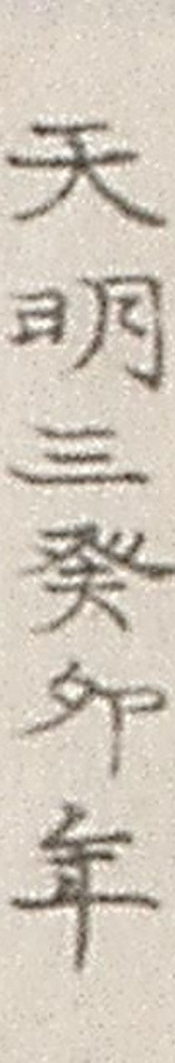天明三癸卯年
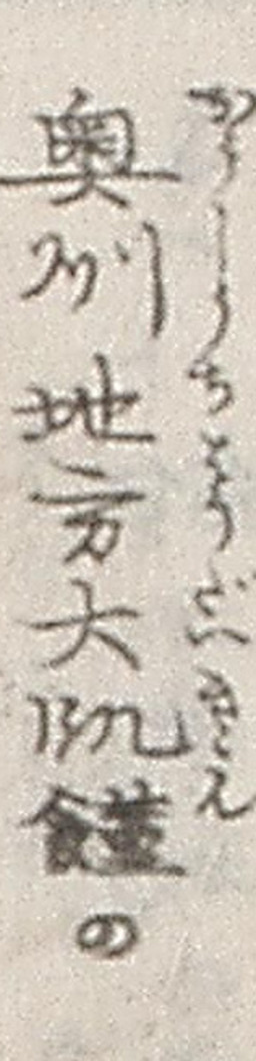奥州地方大飢饉の
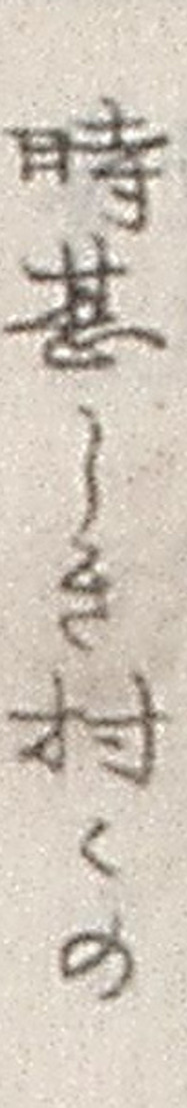時甚しき村〻の
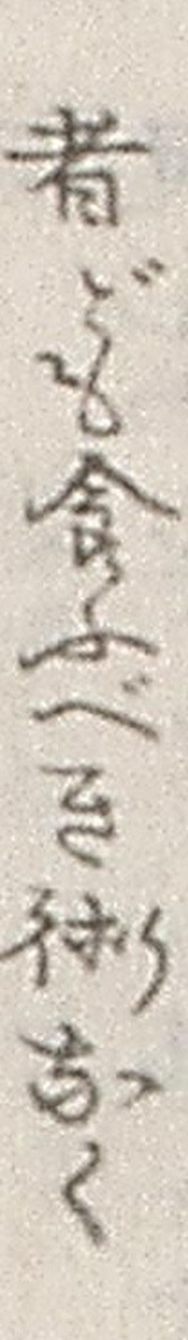者ども食ふべき術なく
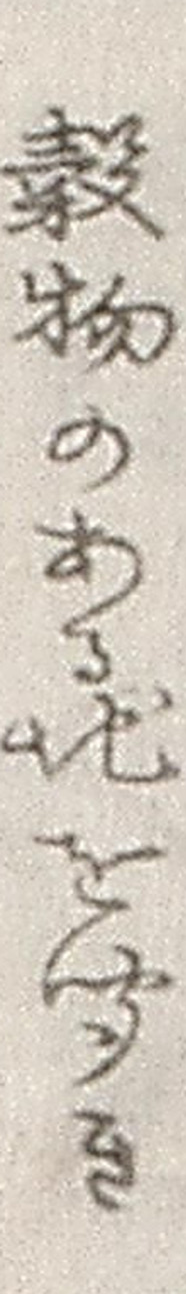穀物のある地を聞き
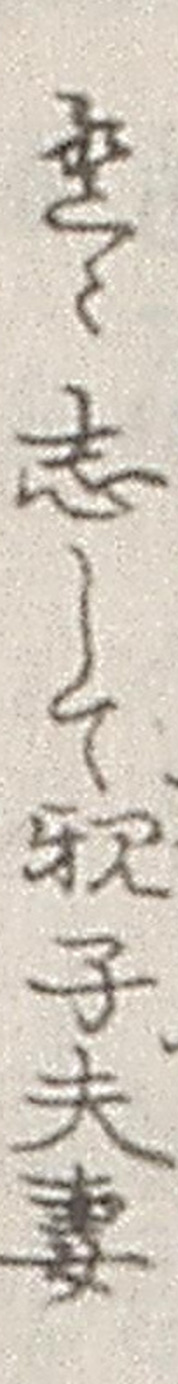遥〻志して親子夫妻
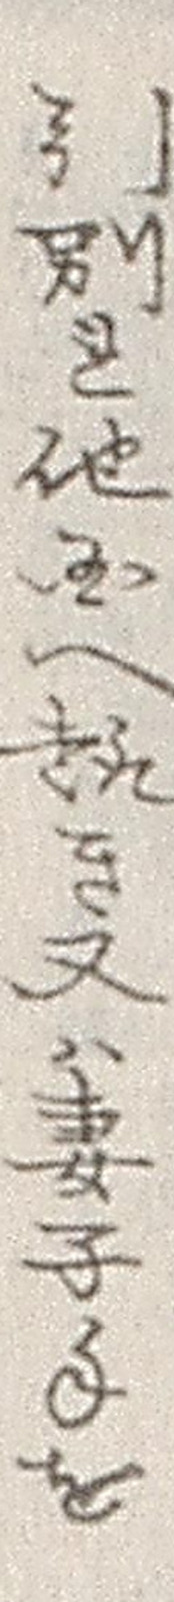引別れ他国へ趣き又は妻子手を
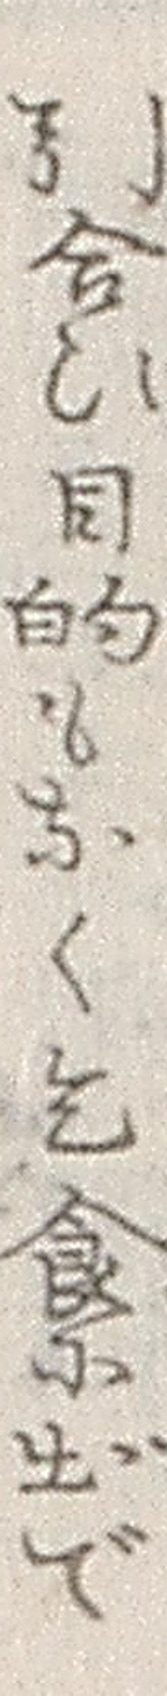引合ひ目的もなく乞食に出で
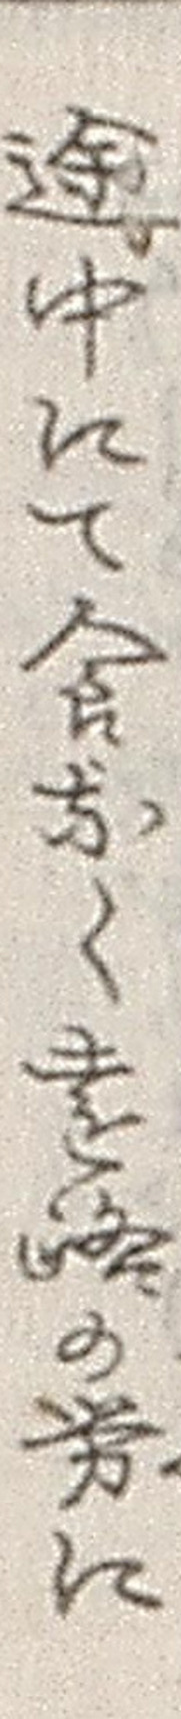途中にて食なく遠路の労に
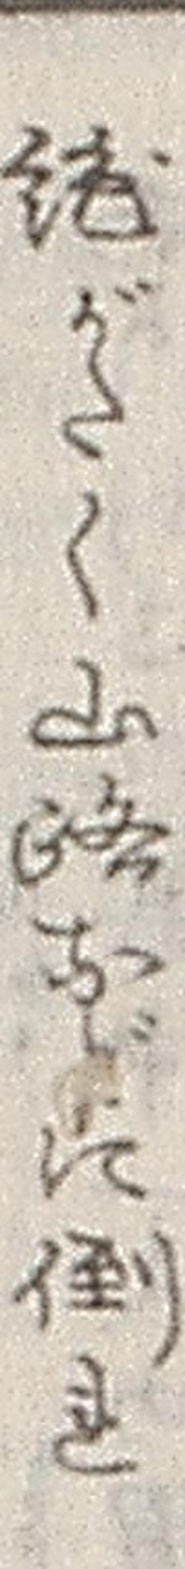絶がたく山路などに倒れ
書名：凶荒図録　完
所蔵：東京大学地震研究所図書室 Earthquake Research Institute Library, The University of Tokyo, JAPAN
